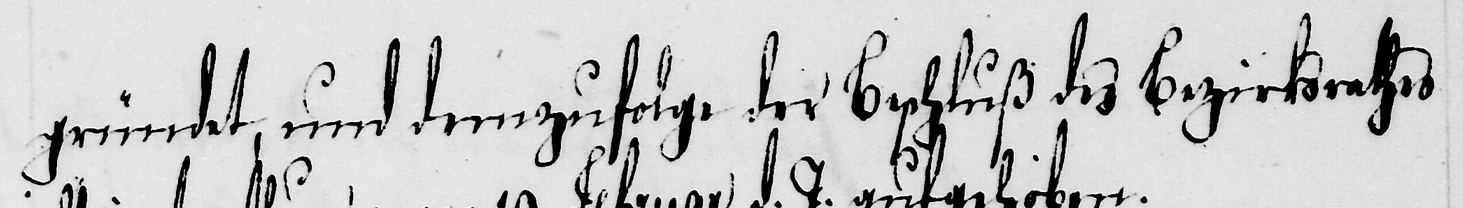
gründet, und demzufolge der Beschluß des Bezirksrathes
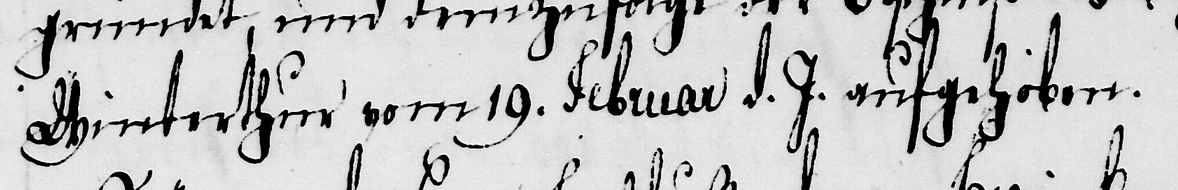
Winterthur vom 19. Februar d. J. aufgehoben.
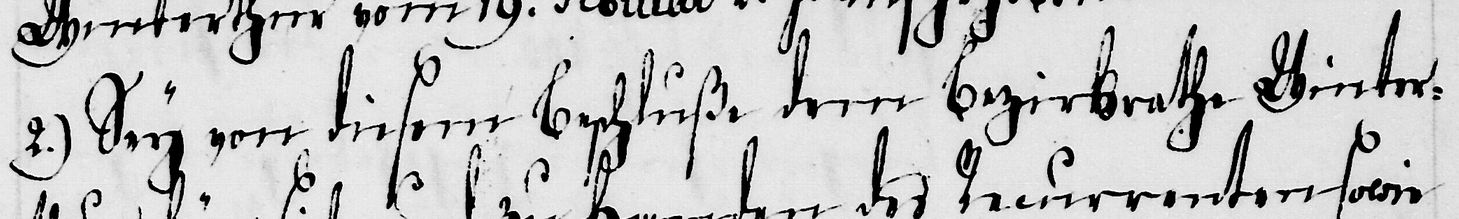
2.) Sey von diesem Beschluße dem Bezirksrathe Winter¬
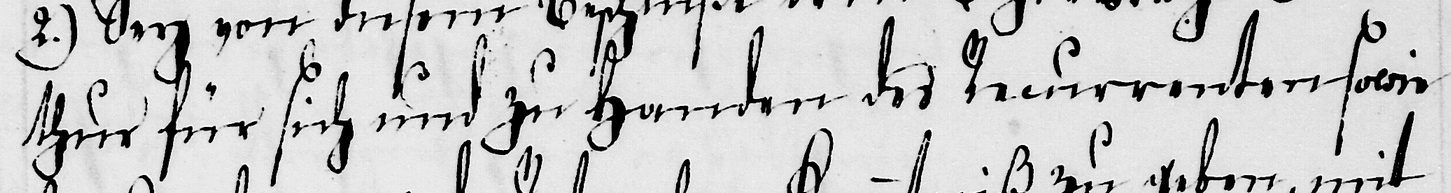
thur für sich und zu Handen des Recurrenten sowie
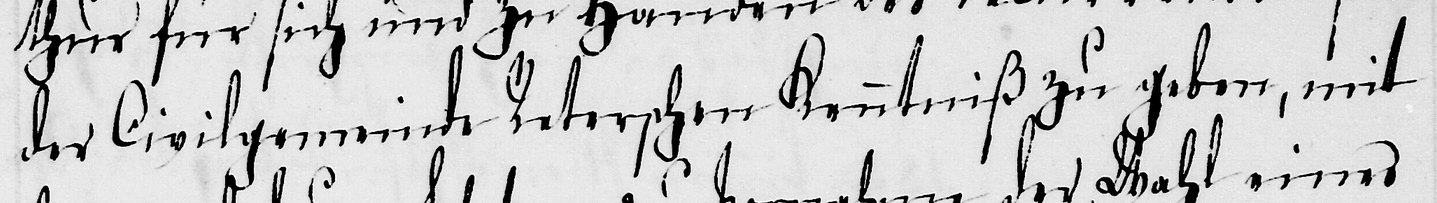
der Civilgemeinde Reterschen Kenntniß zu geben, mit
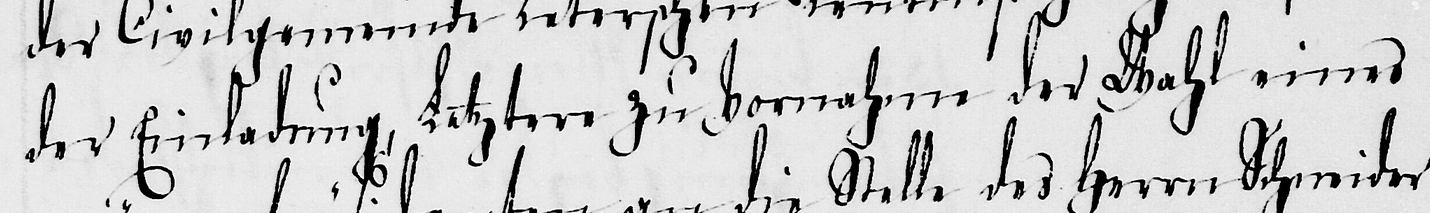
der Einladung, Letztern zu Vornahme der Wahl eines
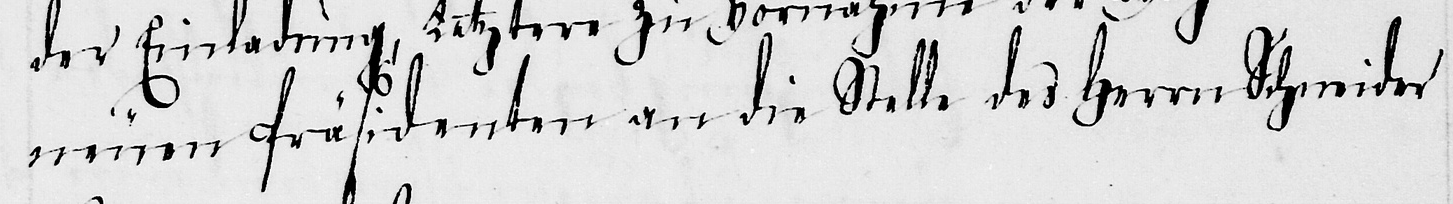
neuen Präsidenten an die Stelle des Herrn Schneider
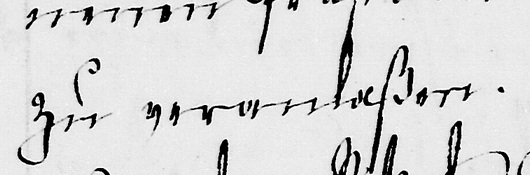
zu veranlaßen.
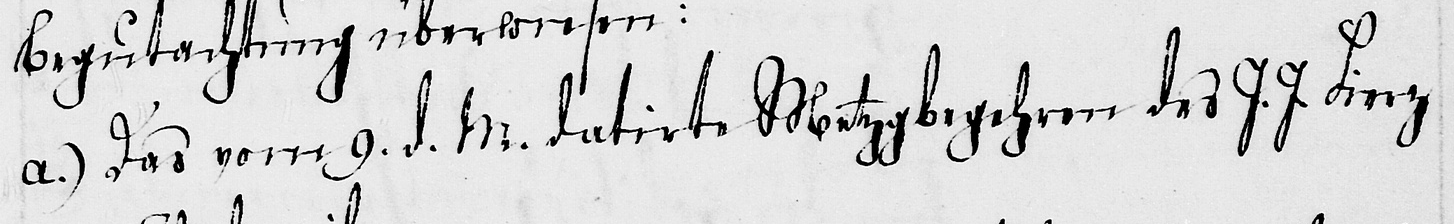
a.) Das vom 9. d. M. datirte Metzgbegehren des J .J. Fierz
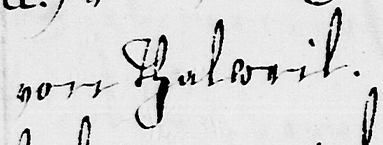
von Thalweil.
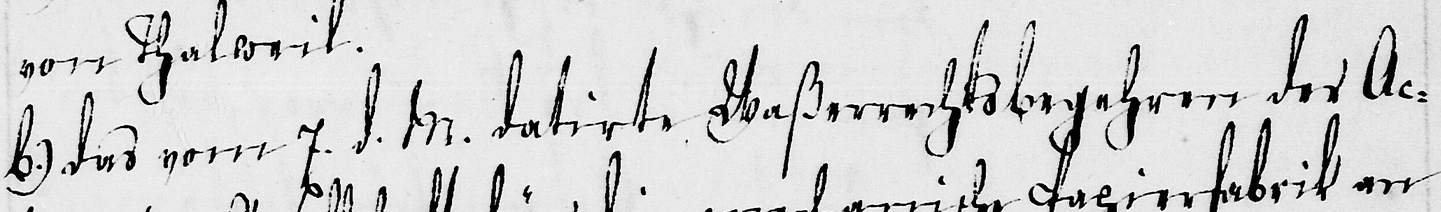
b.) Das vom 7. d. M. datirte Waßerrechtsbegehren der Ac¬
